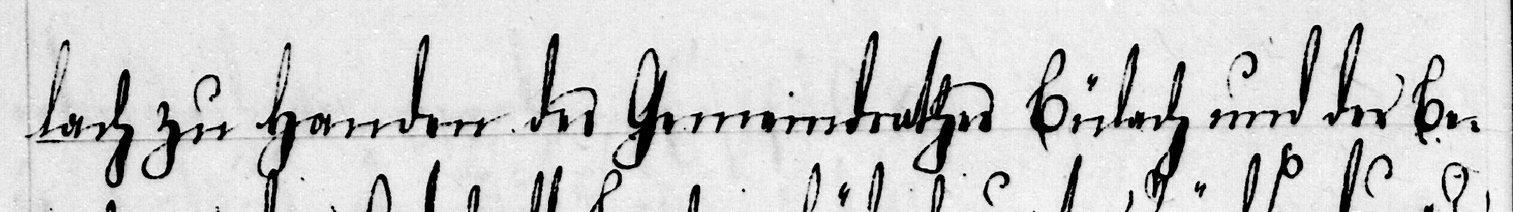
lach zu Handen des Gemeindrathes Bülach und der Be¬
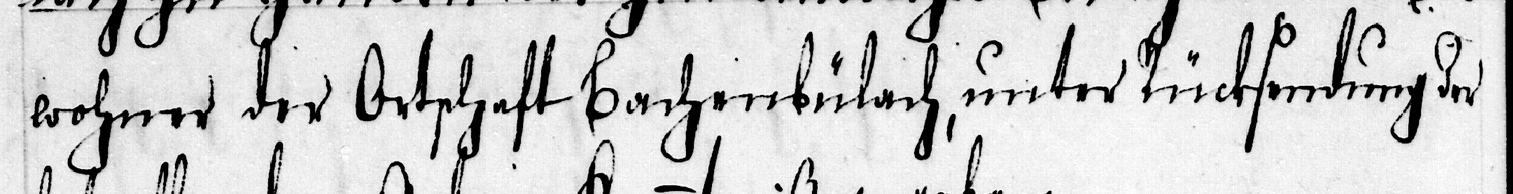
wohner der Ortschaft Bachenbülach, unter Rücksendung der
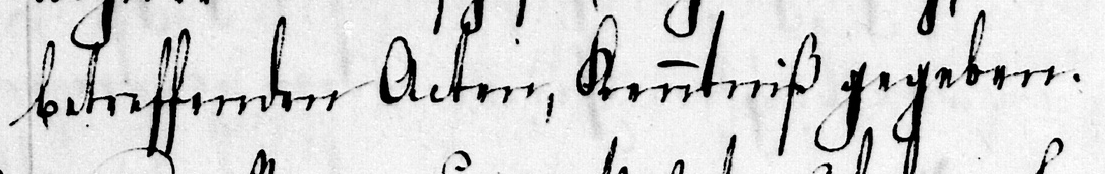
betreffenden Acten, Kenntniß gegeben.
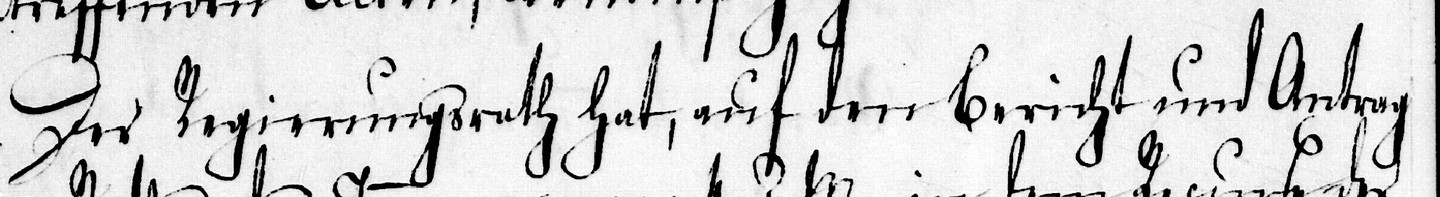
Der Regierungsrath hat, auf den Bericht und Antrag
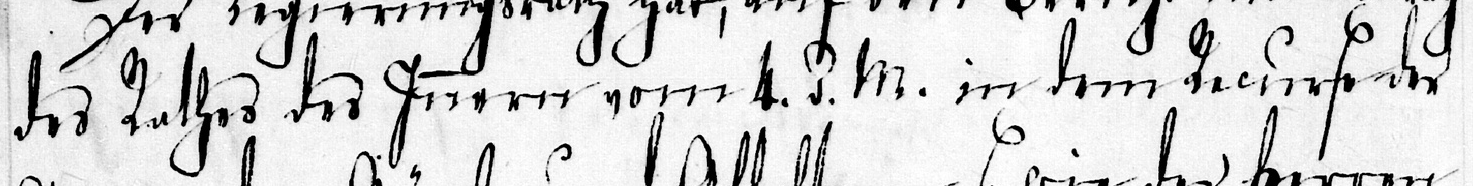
des Rathes des Innern vom 4. d. M. in dem Recurse der
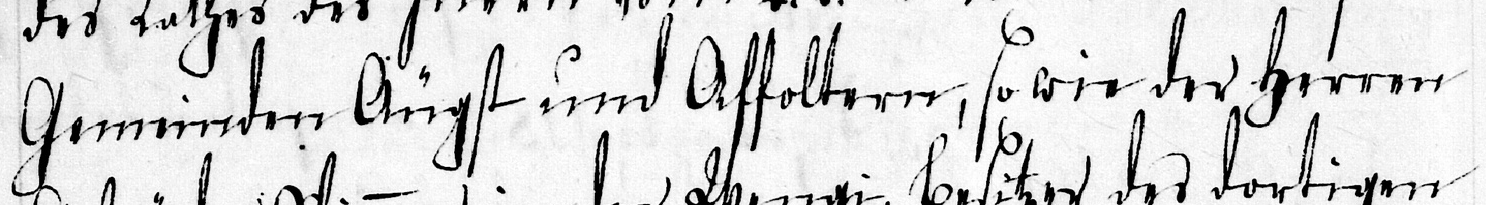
Gemeinden Äugst und Affoltern, sowie der Herren
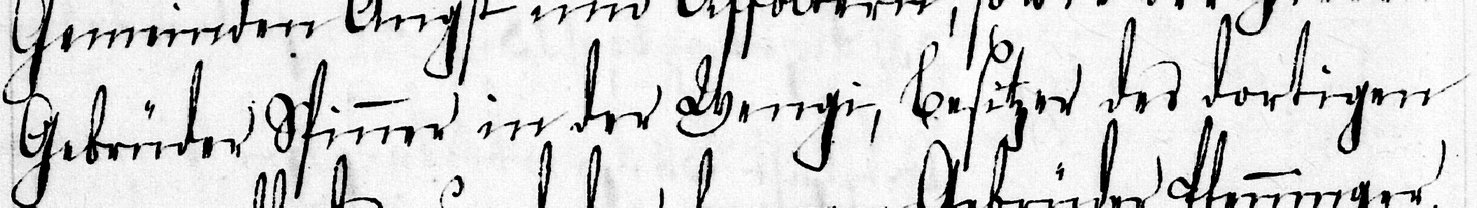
Gebrüder Spinner in der Wengi, Besitzer des dortigen
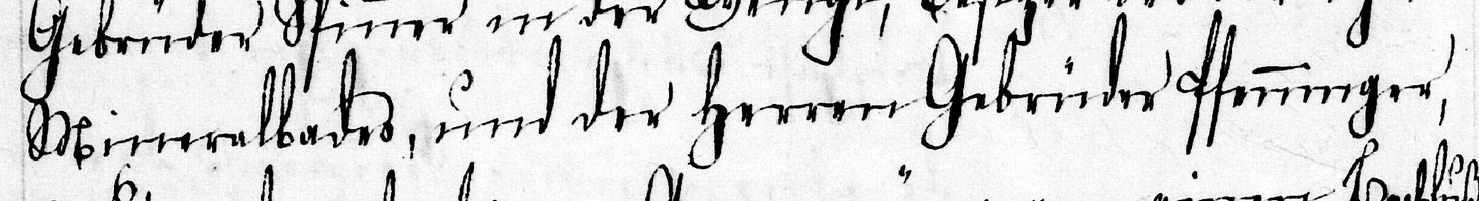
Mineralbades, und der Herren Gebrüder Pfenninger,
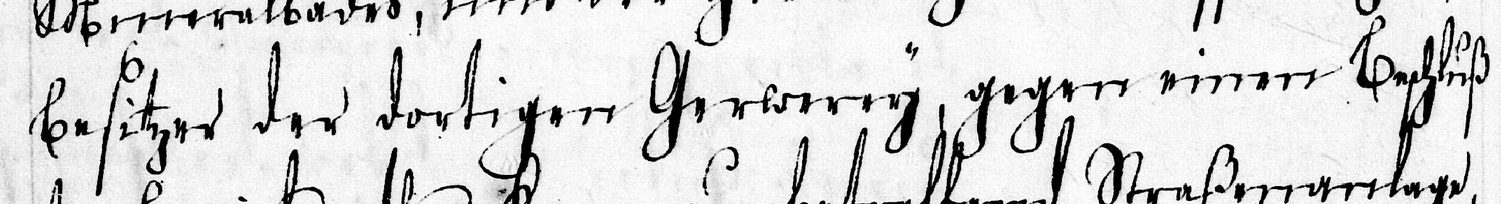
Besitzer der dortigen Gerwerey, gegen einen Beschluß
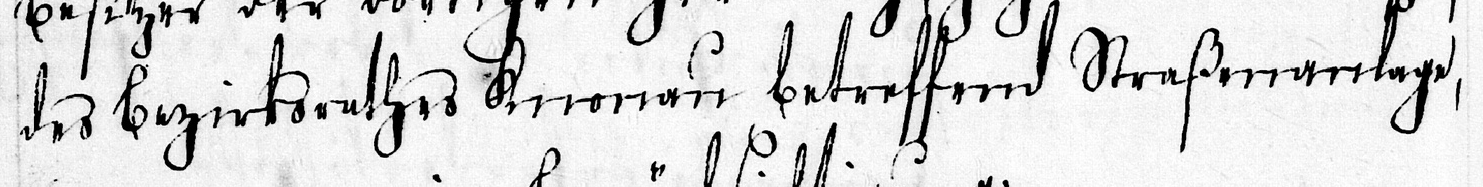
des Bezirksrathes Knonau betreffend Straßenanlage,
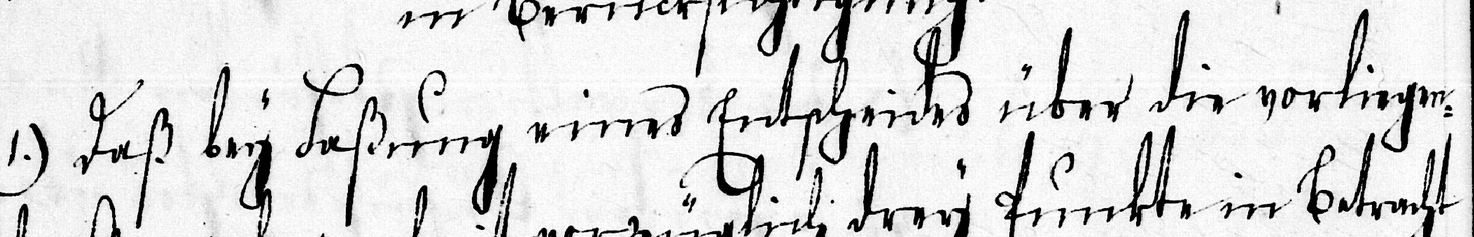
1.) Daß bey Faßung eines Entscheides über die vorliege¬
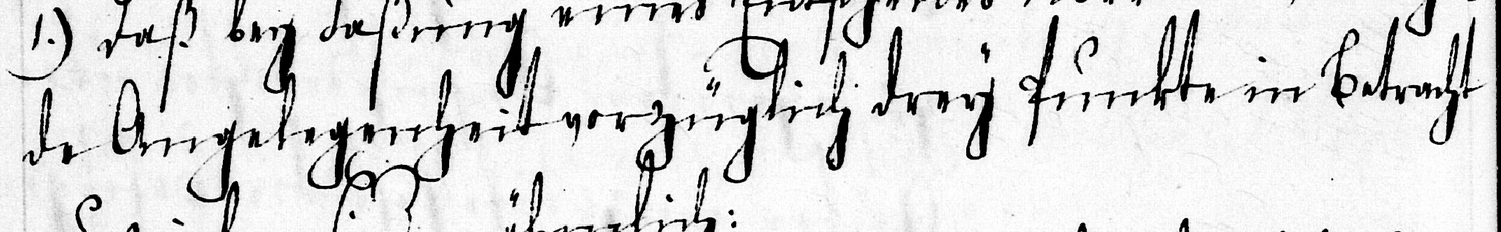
nde Angelegenheit vorzüglich drey Punkte in Betracht
